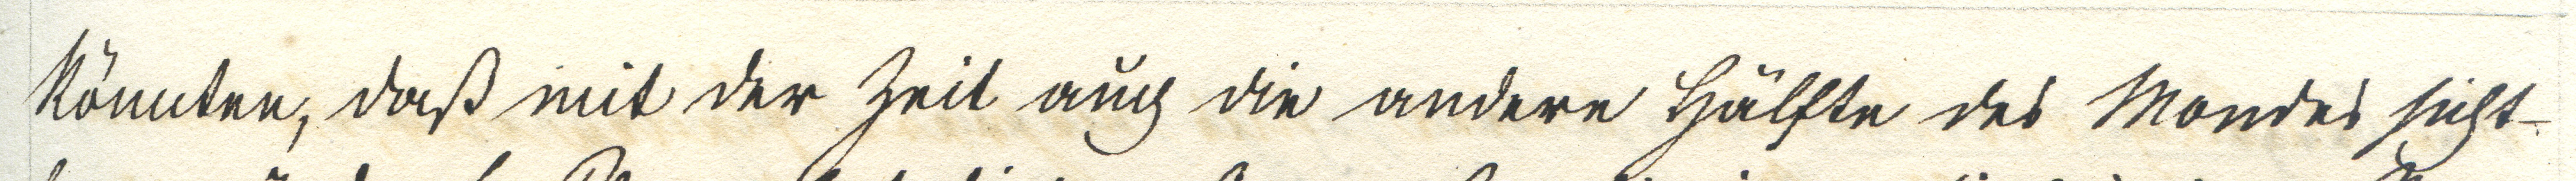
könnten, daß mit der Zeit auch die andere Hälfte des Mondes sicht-
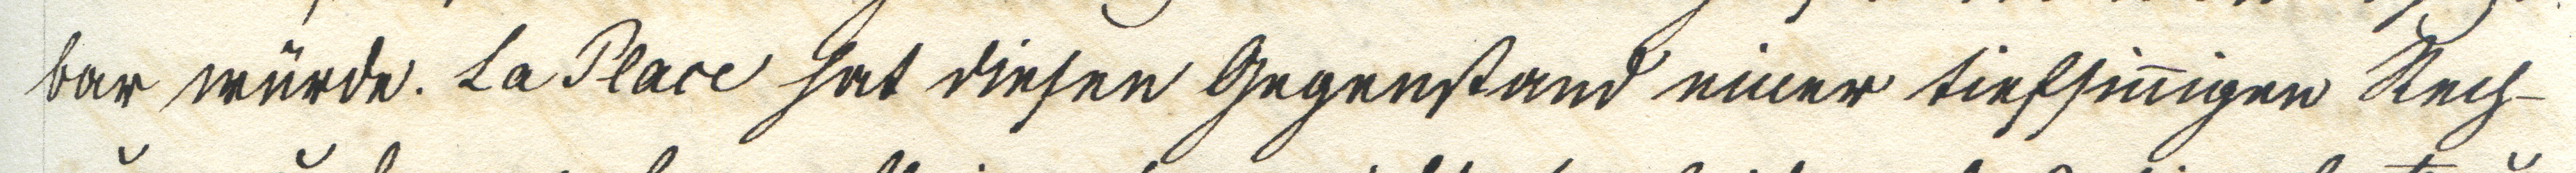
bar würde. La Place hat diesen Gegenstand einer tiefsiñigen Rech-
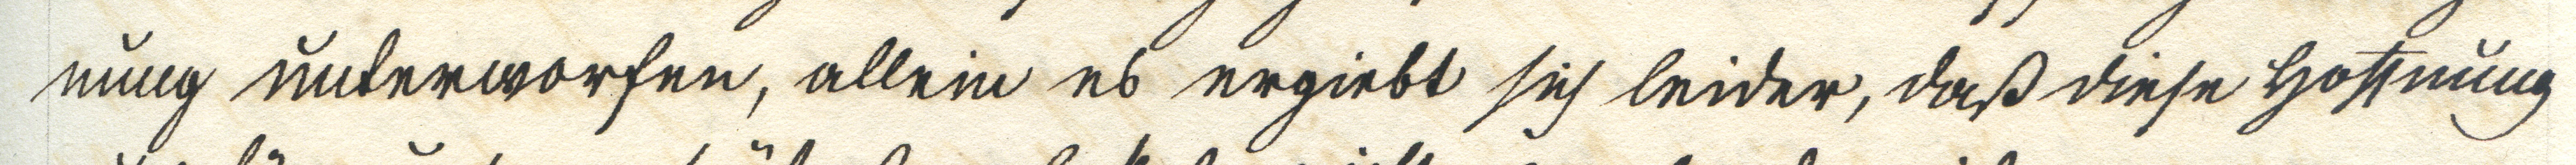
nung unterworfen, allein es ergiebt sich leider, daß diese Hoffnung
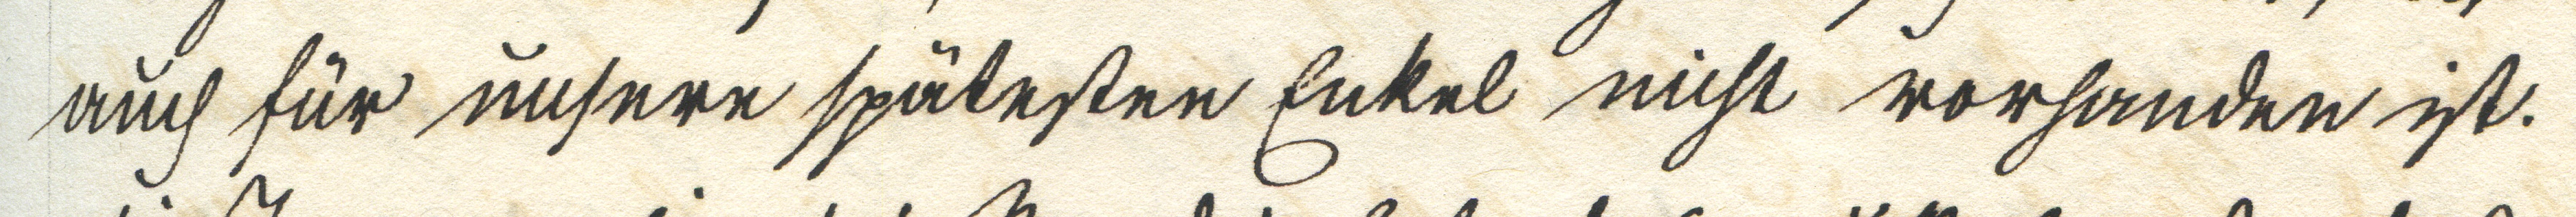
auch für unsere spätesten Enkel nicht vorhanden ist.
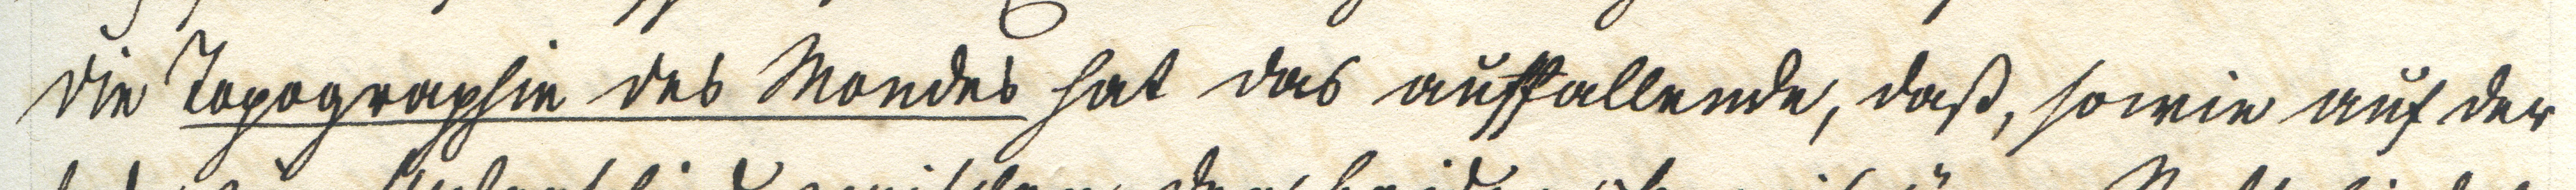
Die Topographie des Mondes hat das auffallende, daß, so wie auf der
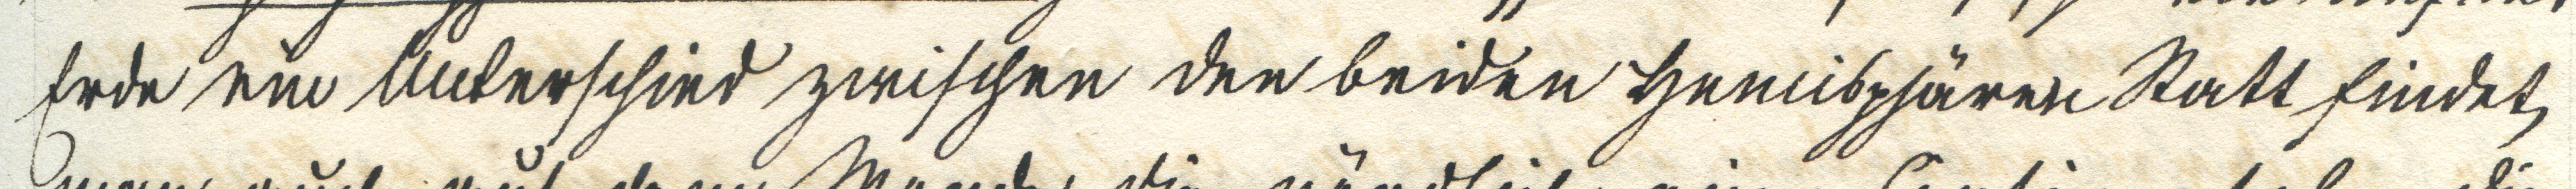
Erde ein Unterschied zwischen den beiden Hemisphären Statt findet,
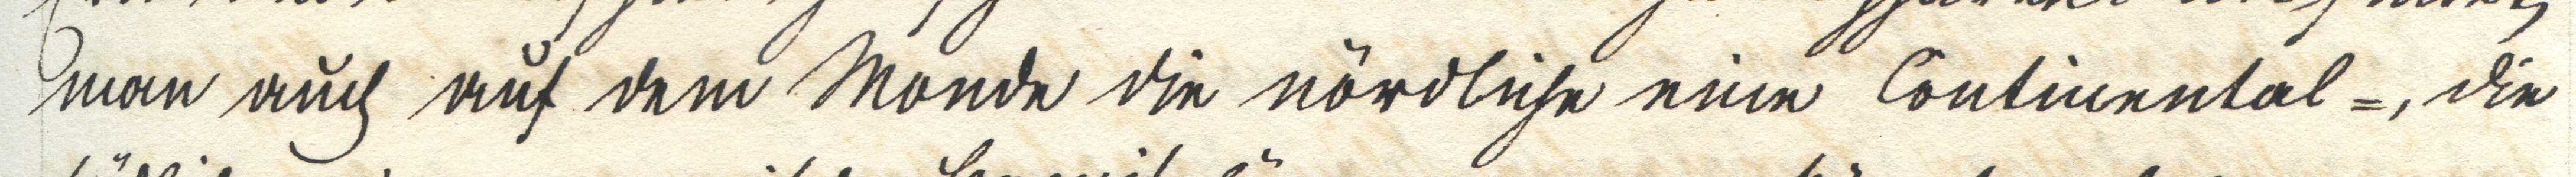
man auch auf dem Monde die nördliche eine Continental-, die
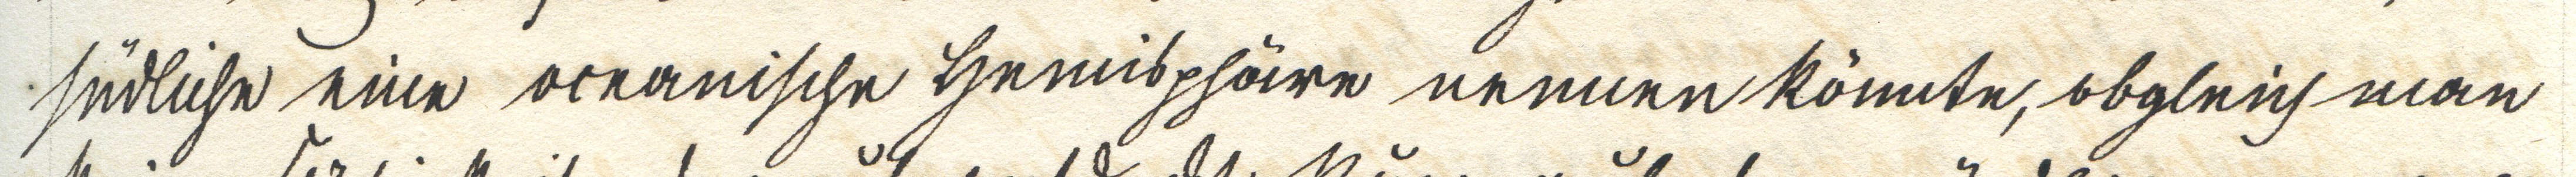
südliche eine oceanische Hemisphäre nennen könnte, obgleich man
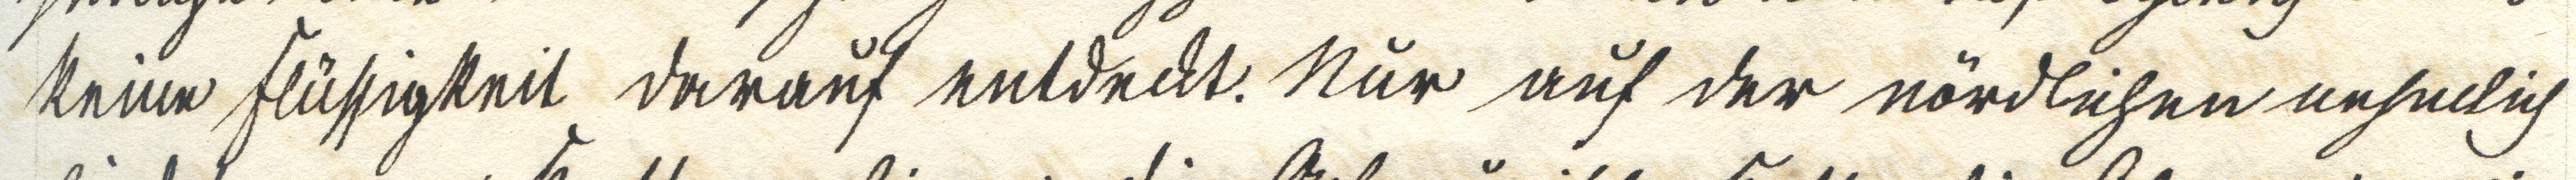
keine Flüssigkeit darauf entdeckt. Nur auf der nördlichen nehmlich
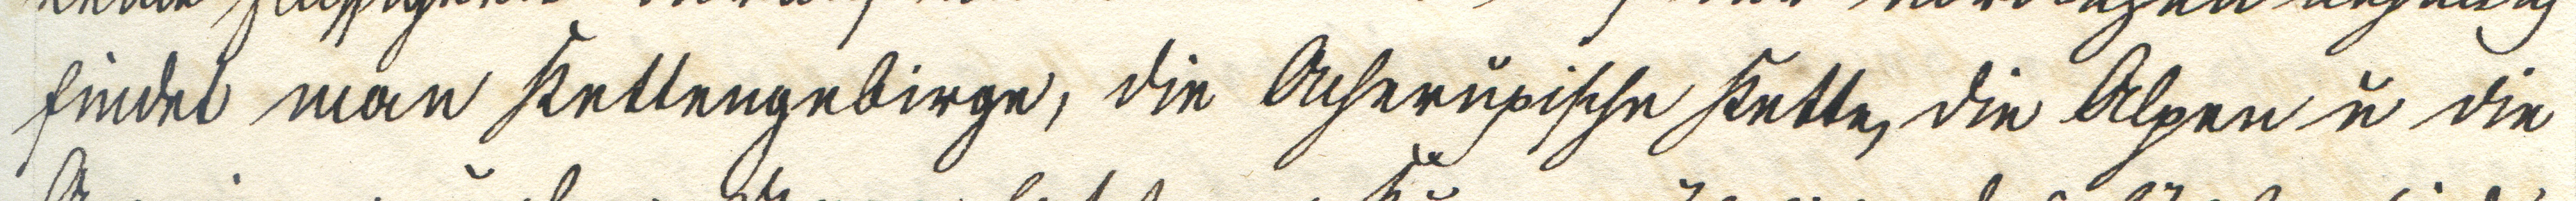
findet man Kettengebirge, die Acherupische Kette, die Alpen u die
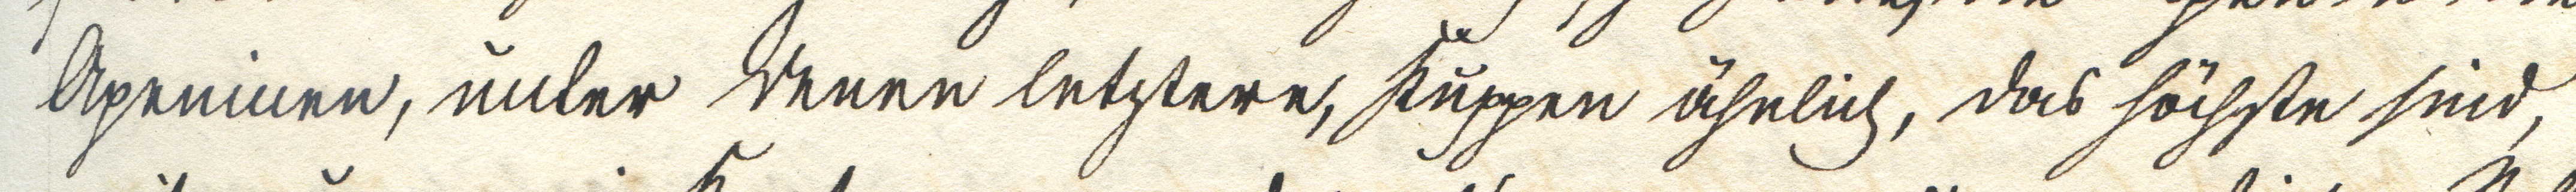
Apeninen, unter denen letztere, Kuppen ähnlich, das höchste sind,
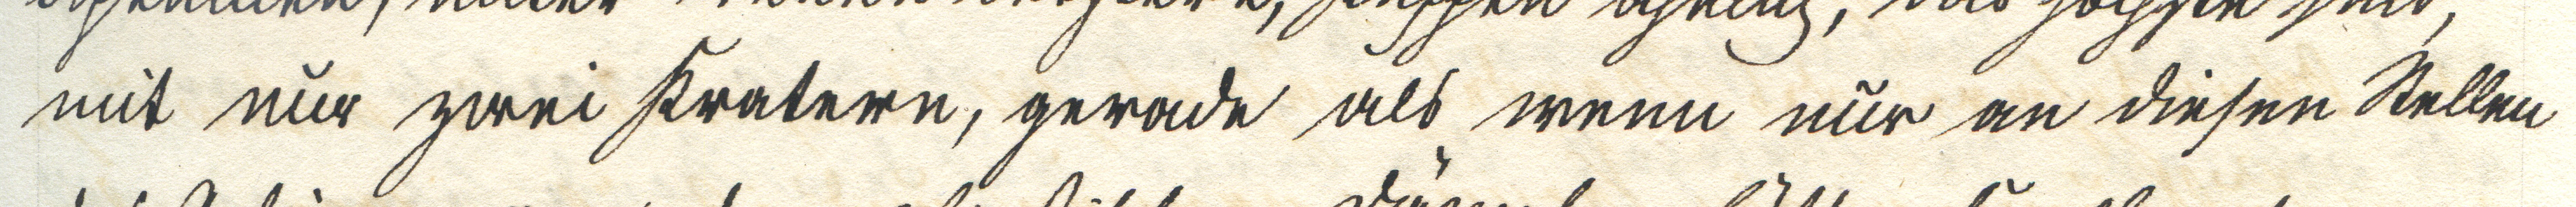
mit nur zwei Kratern, gerade als wenn nur an diesen Stellen
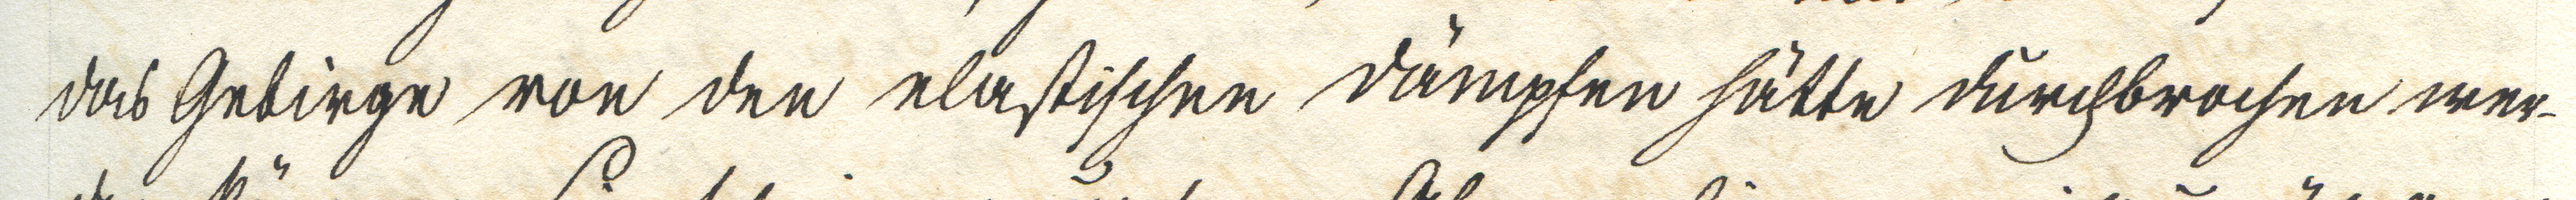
das Gebirge von den elastischen Dämpfen hätte durchbrochen wer-
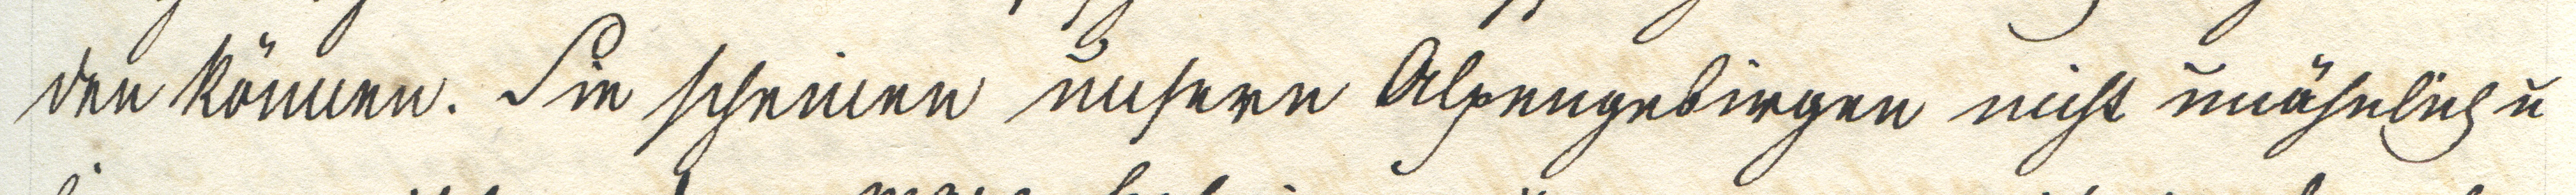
den können. Sie scheinen unsern Alpengebirgen nicht unähnlich u
